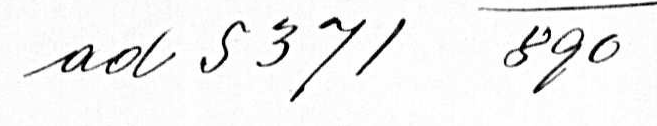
ad 5371 890
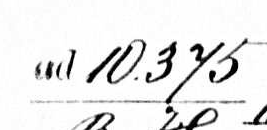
ad 10.375
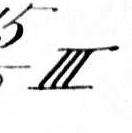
III
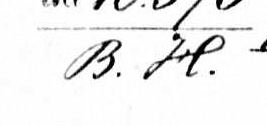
B. H.
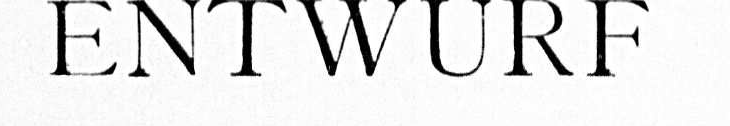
Entwurf
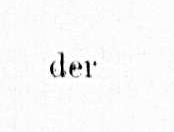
der
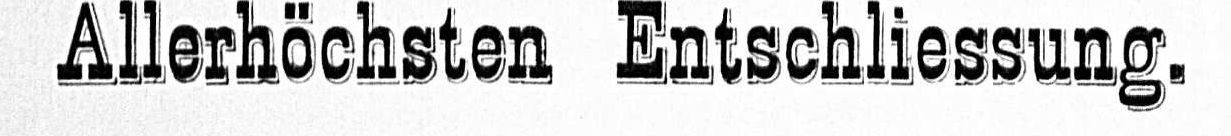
Allerhöchsten Entschliessung.
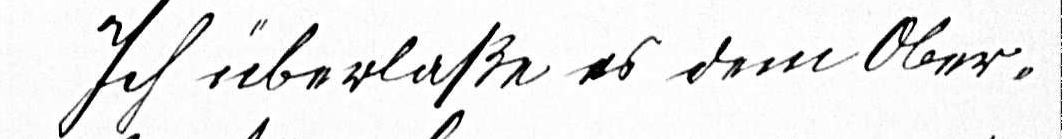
Jch überlaße es dem Ober¬
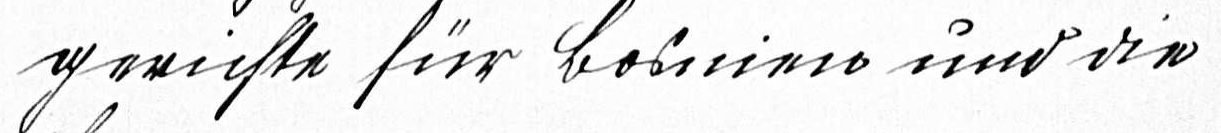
gerichte für Bosnien und die
